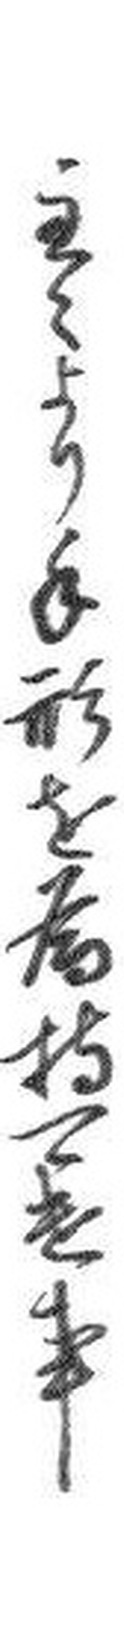主々より手形を為持可遣事
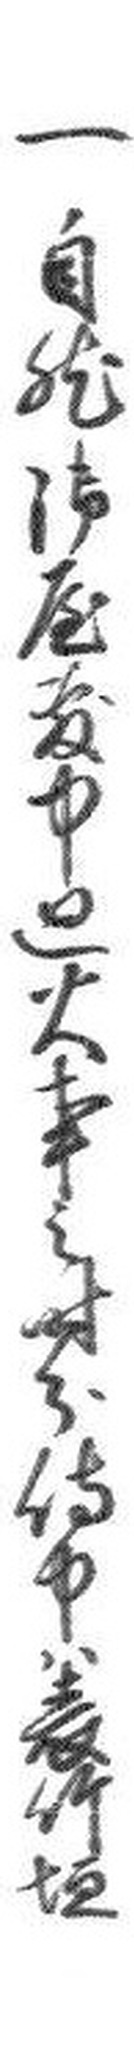一自然御屋敷中廻火事之時分侍中ハ表竹垣
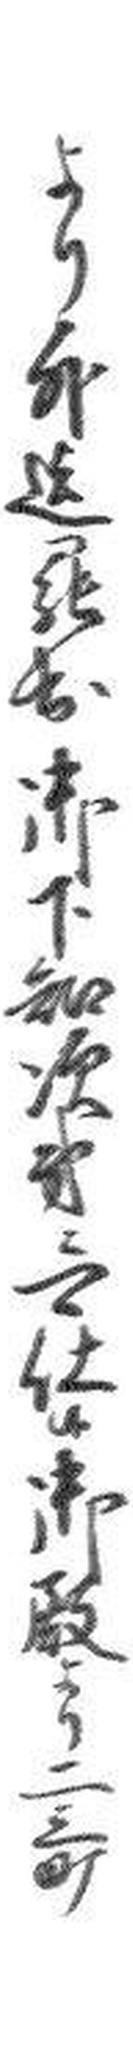より外迄罷出御下知次第ニ可仕候御殿より二三町
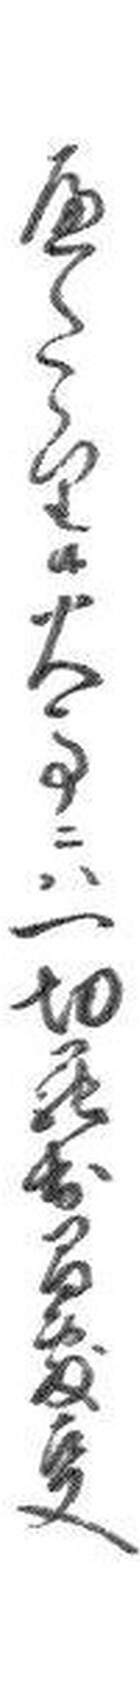へたゝり候火事ニハ一切罷出間敷事
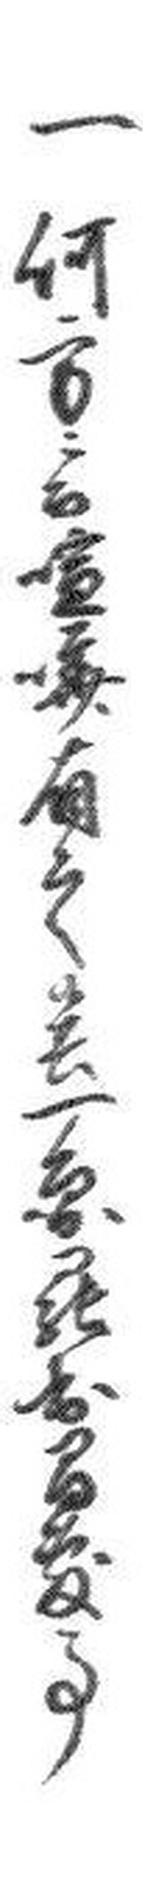一何方ニ而喧嘩有之候共一円罷出間敷事
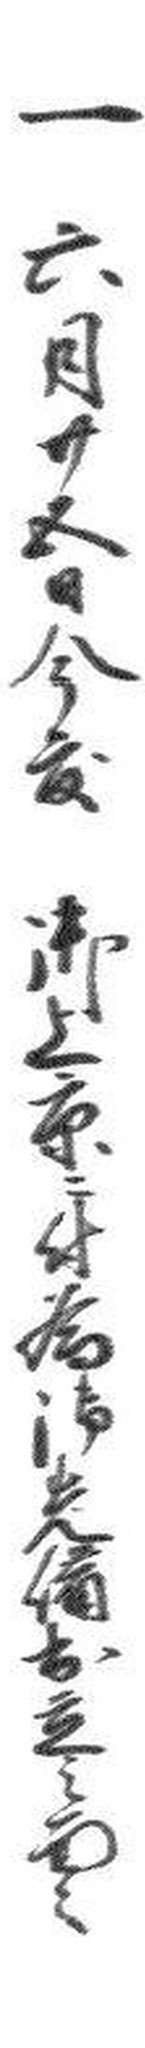一六月廿五日今度御上京ニ付為御先備出立之面々
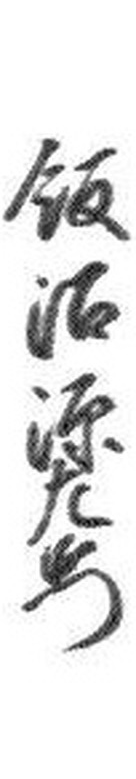飯沼源左衛門

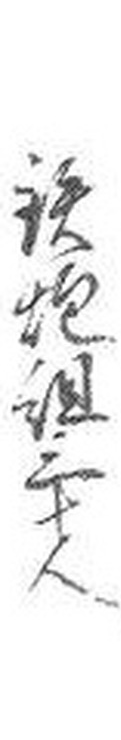鉄炮組三十人
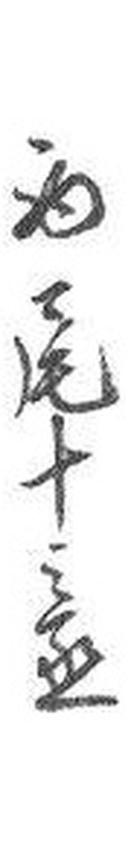西尾十之丞
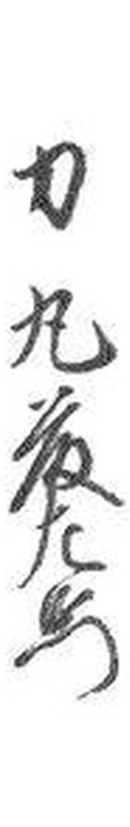力丸藤左衛門
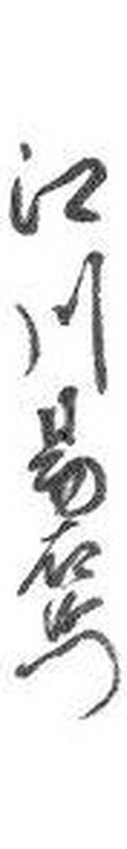江川易右衛門
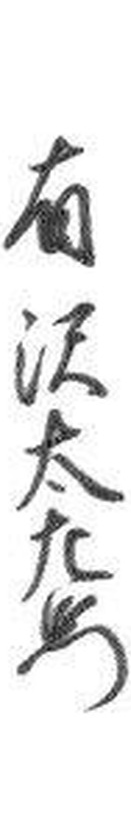有沢太左衛門
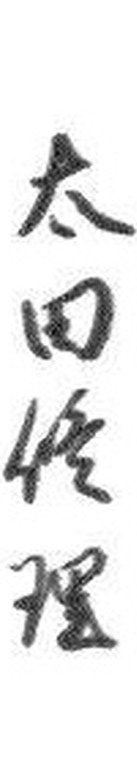太田修理
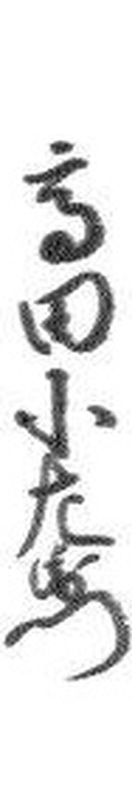高田小左衛門
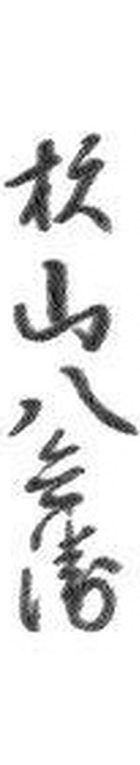杉山八兵衛
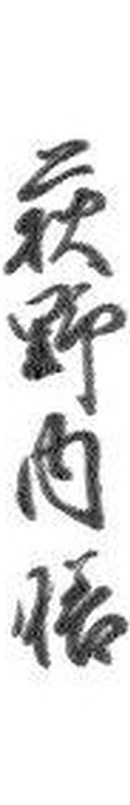萩野内膳
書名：家譜 四 忠昌公 従寛永七年到正保四年
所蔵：福井県文書館 Fukui Prefectural Archives
